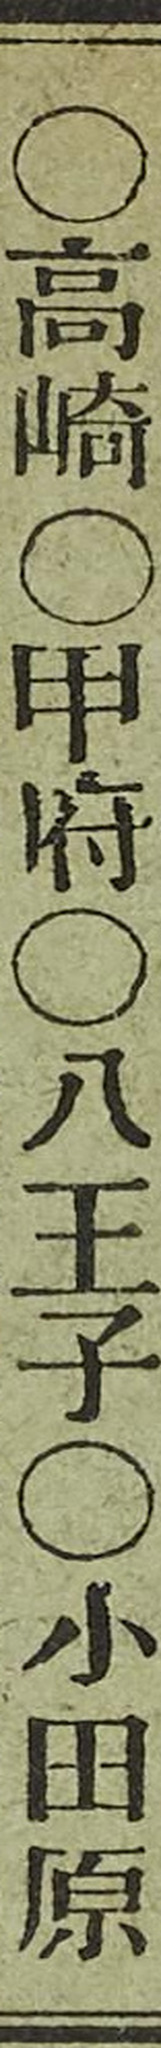○高崎○甲府○八王子○小田原
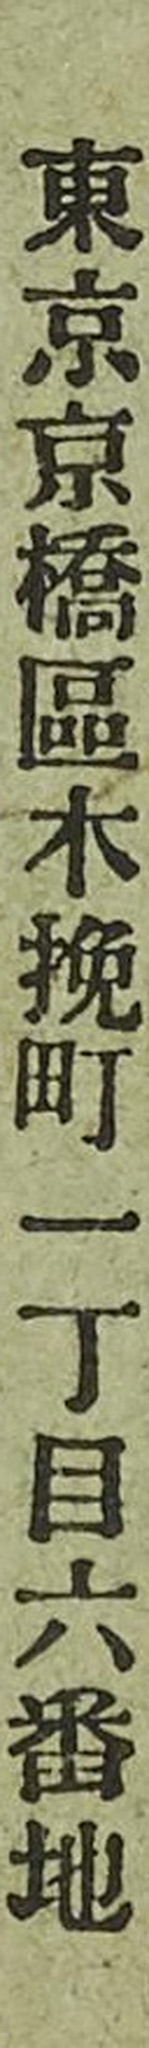東京京橋区木挽町一丁目六番地
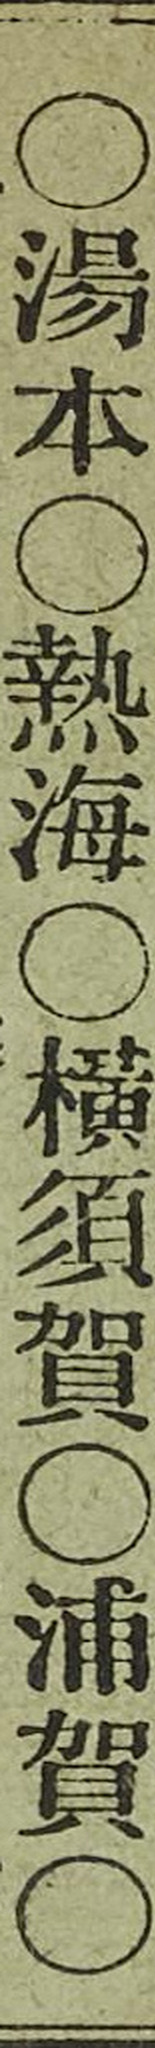○湯本○熱海○横須賀○浦賀○
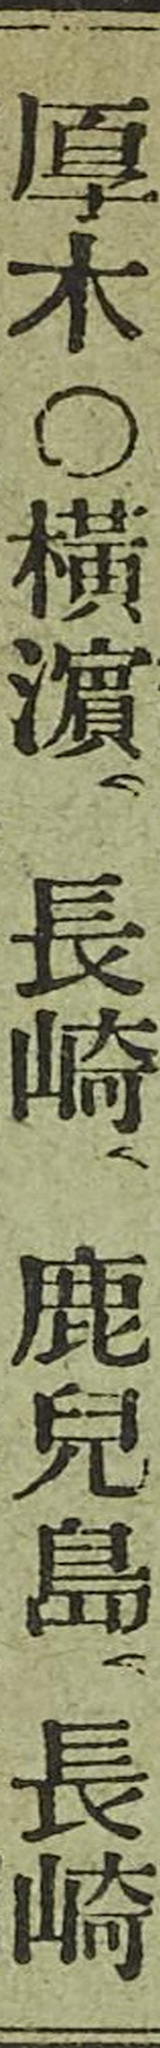厚木○横浜、長崎、鹿児島、長崎
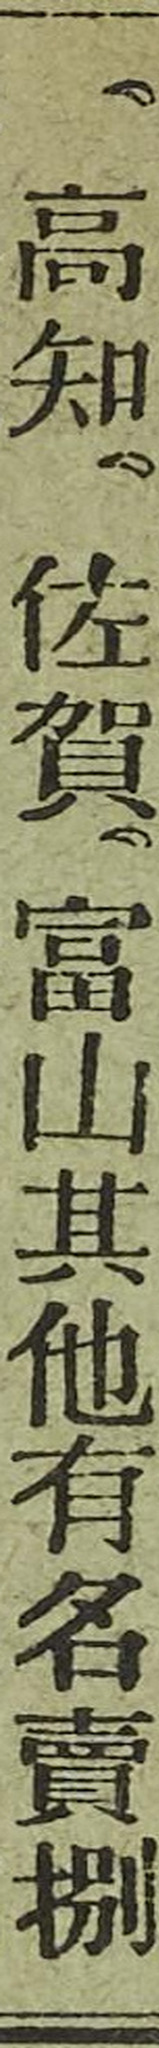、高知、佐賀、富山其他有名売捌
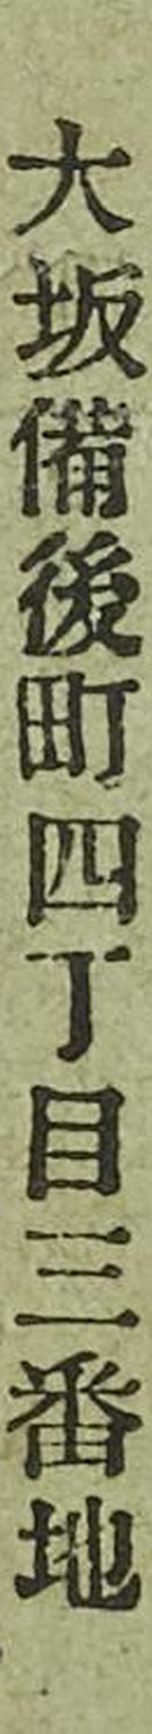大坂備後町四丁目三番地
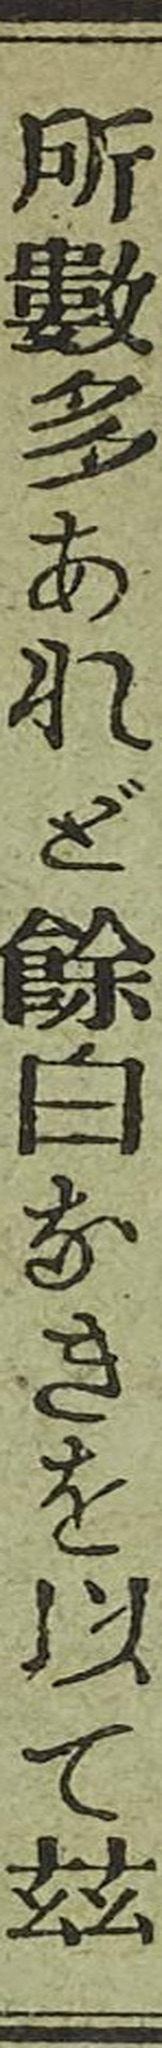所数多あれど余白はきを以て茲
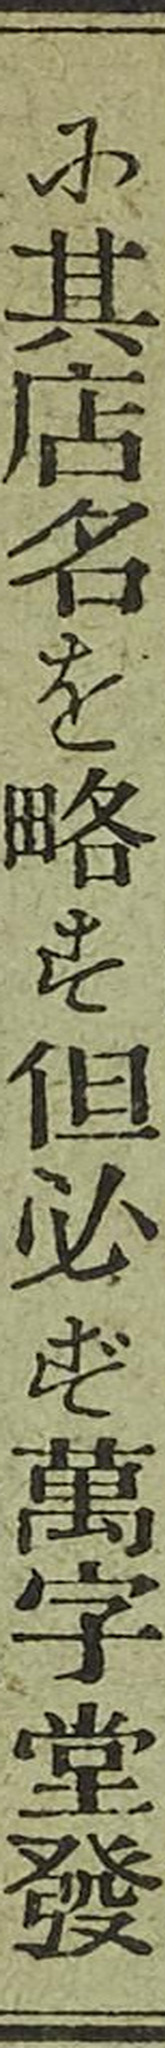に其店名を略す但必ず萬字堂発
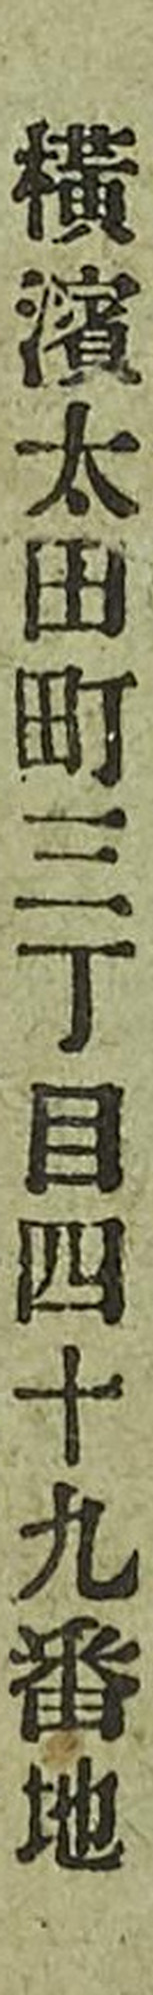横浜太田町三丁目四十九番地
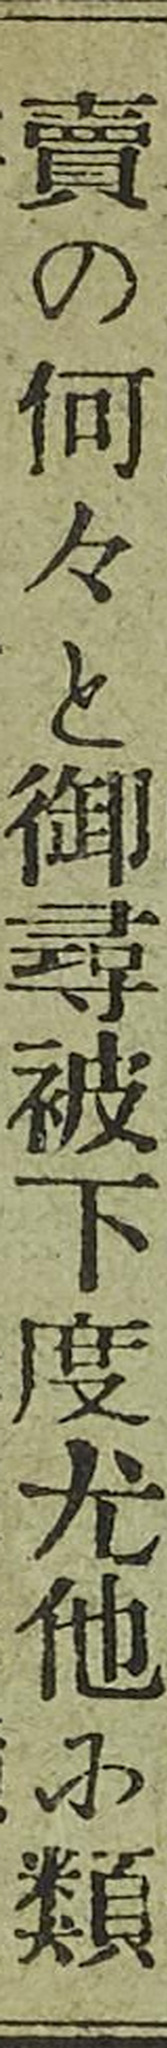売の何々と御尋被下度尤他に類
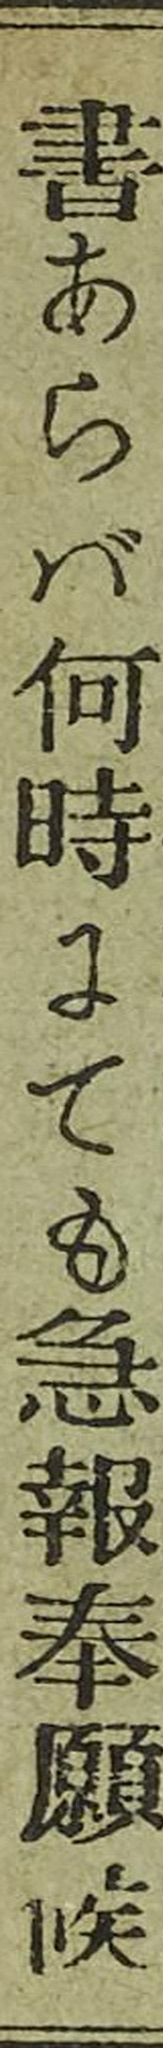書あらば何時にても急報奉願上候
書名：永代惨話　文化の夢　全
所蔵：東京大学地震研究所図書室 Earthquake Research Institute Library, The University of Tokyo, JAPAN
